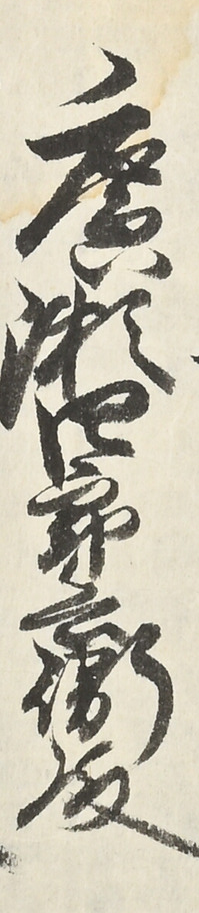廣瀬四郎兵衛殿
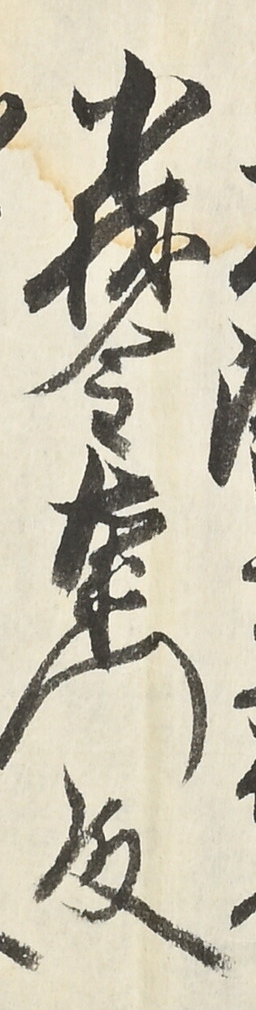小林金右衛門殿
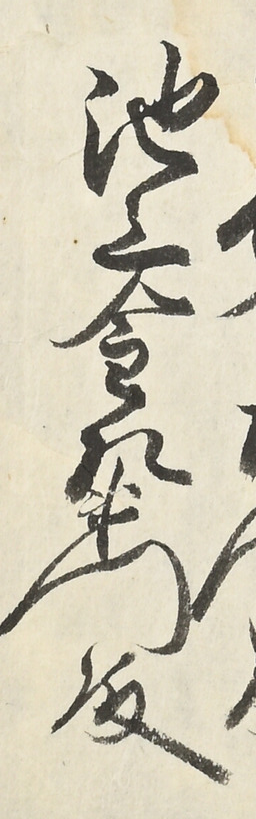池上金左衛門殿

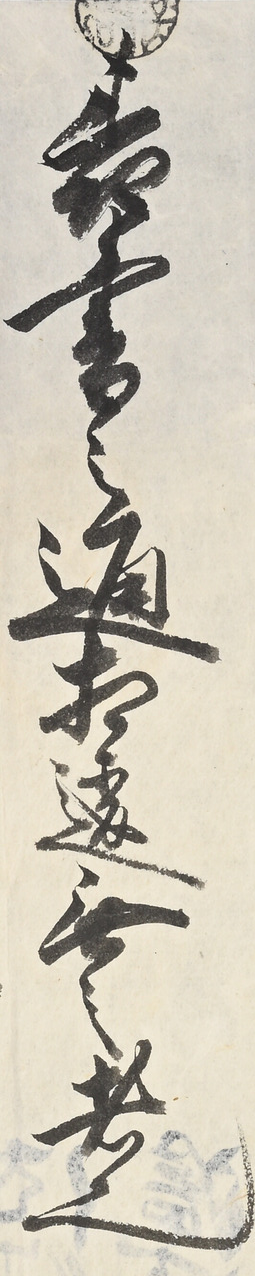表書之通相違無之者也
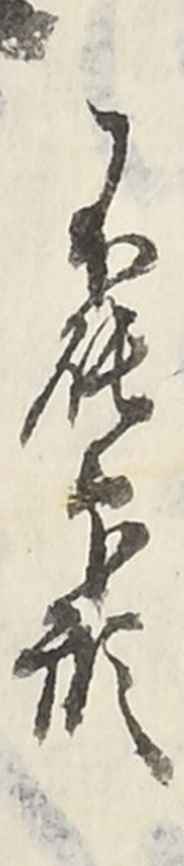不能印形

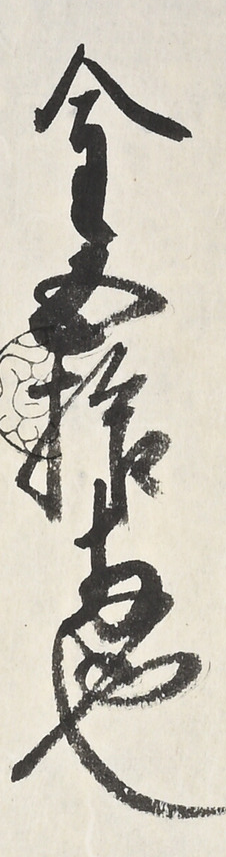金五拾両也
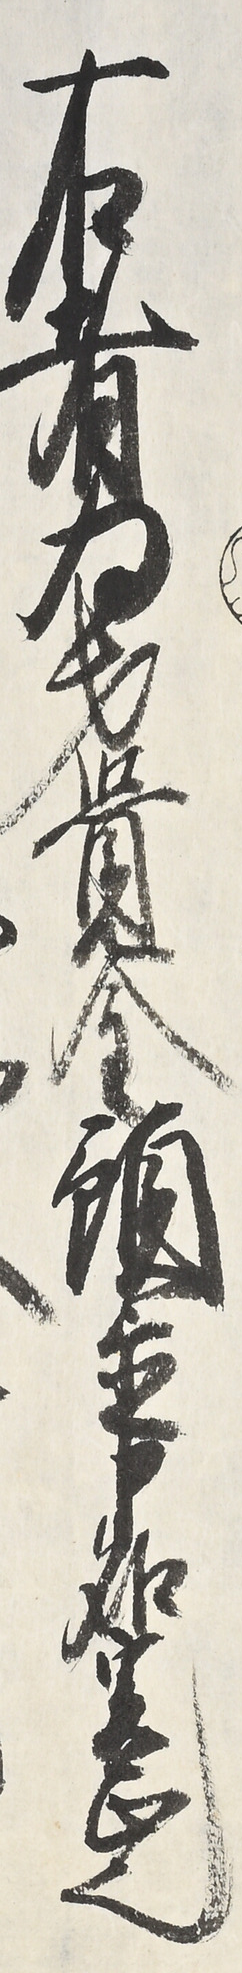右者為才覚金預置申処実正也
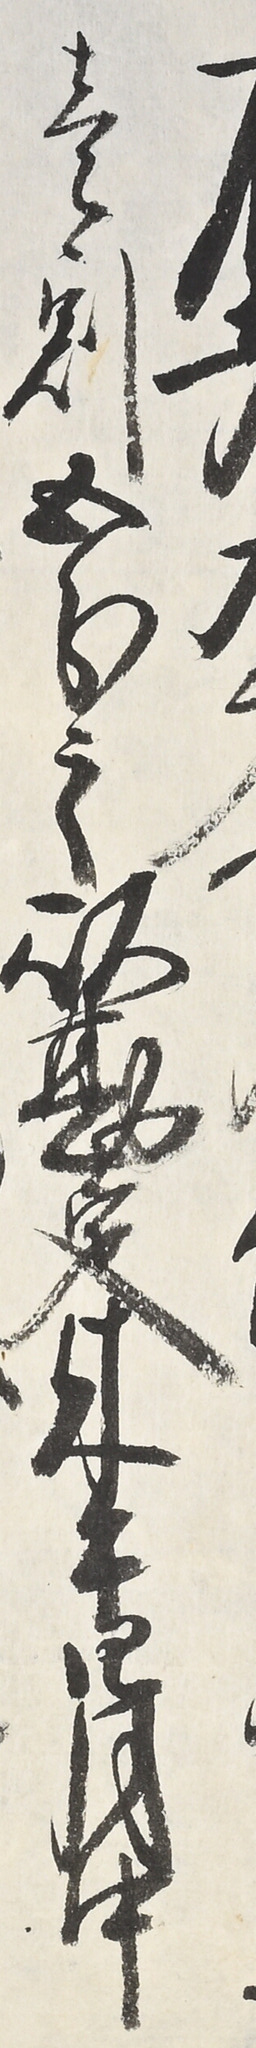壱割五分之証勘定来年午四月中
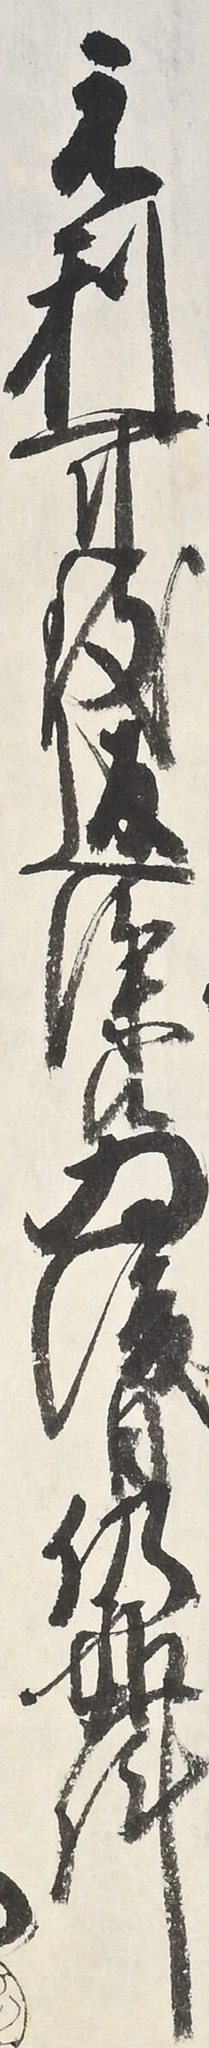元利可致返済候為後日仍如件
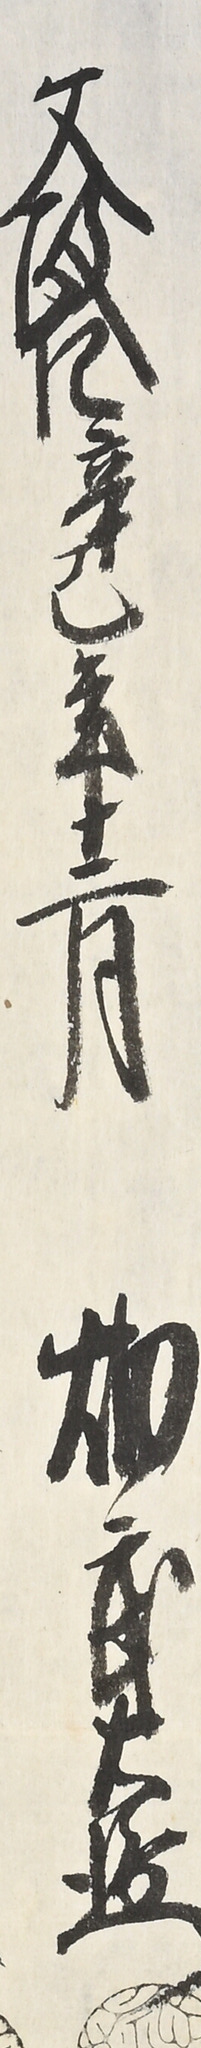文政四辛巳年十二月畑武右衛門㊞
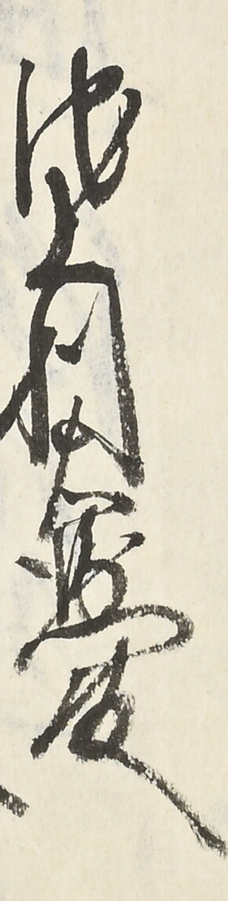池上利右衛門殿
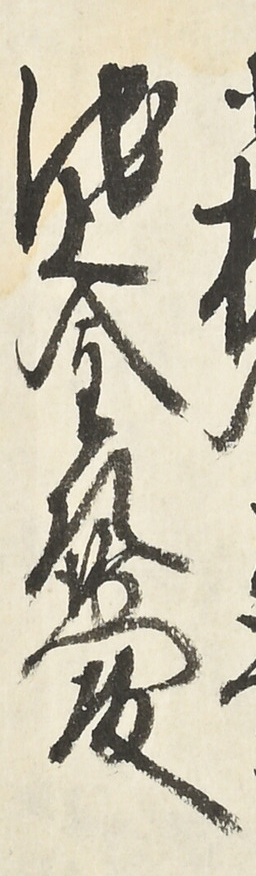池上金左衛門殿

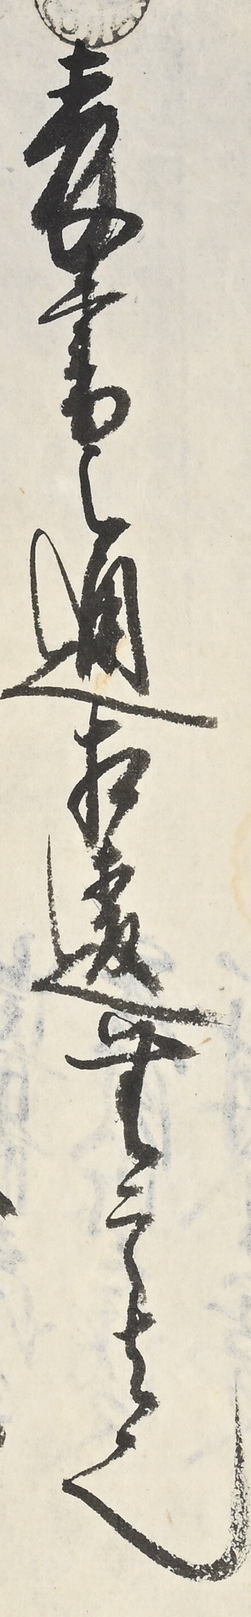表書之通相違無之者也
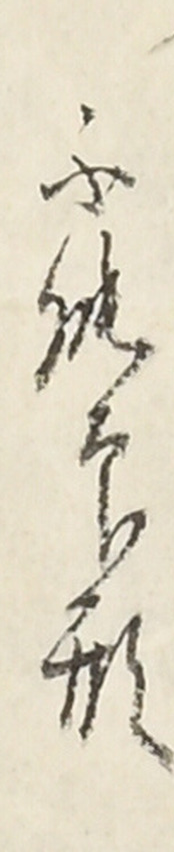不能印形

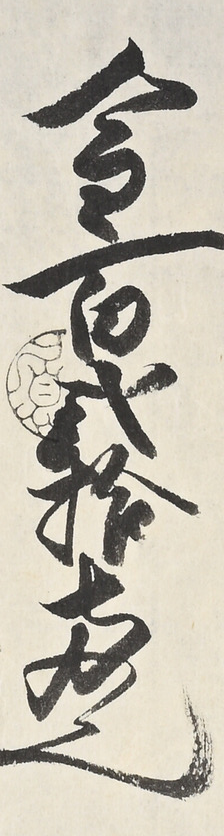金百弐拾両也
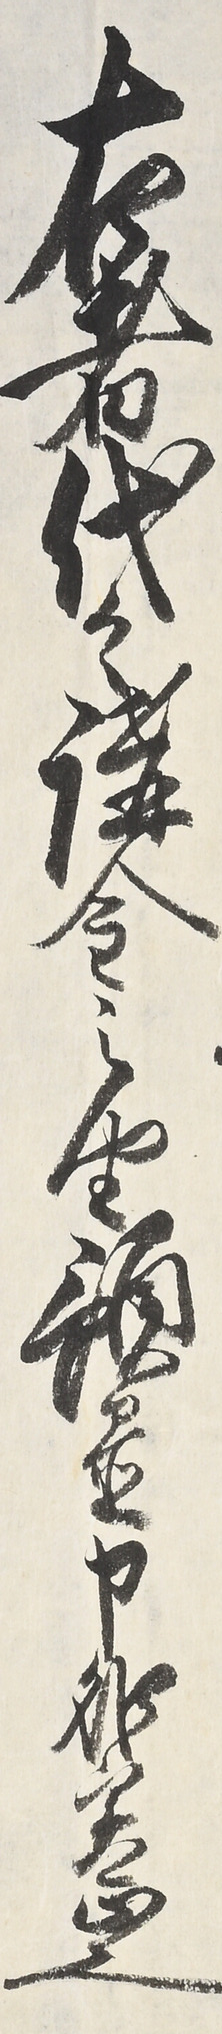右者代々講金之由預置申処実正也
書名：覚
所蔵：伊那市立高遠町図書館・合同会社AMANE
